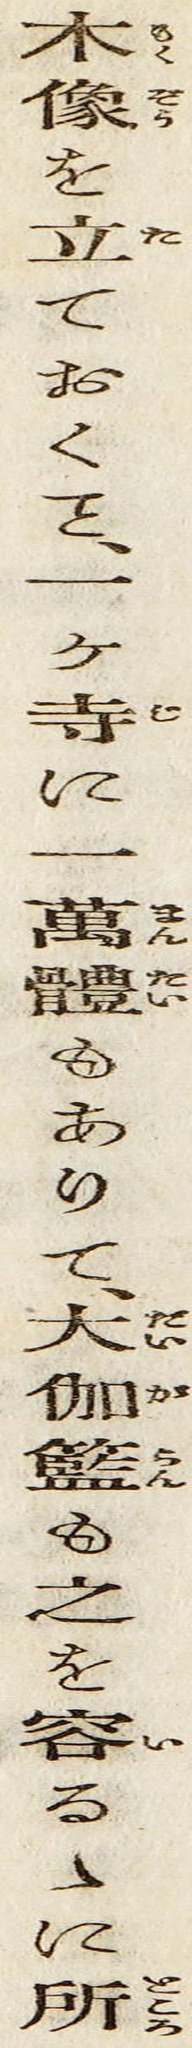木像を立ておくこと、一ヶ寺に一万体もありて、大伽籃も之を容るゝに所
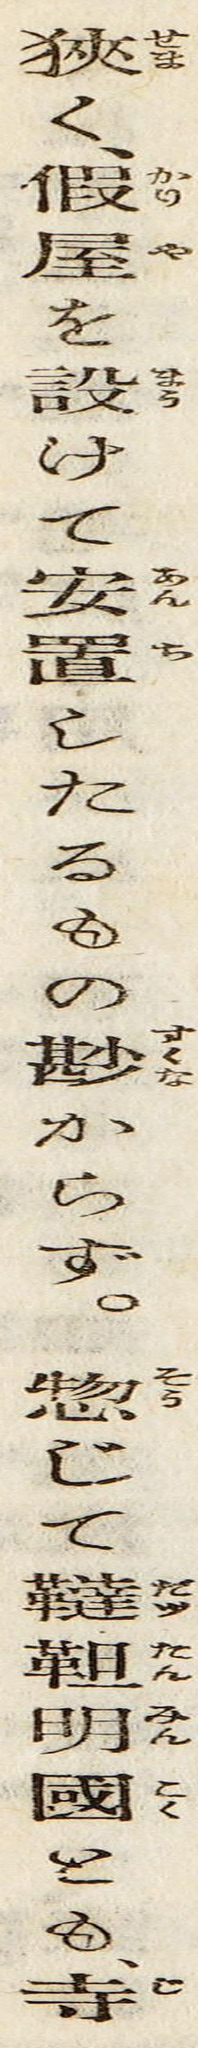狭く、仮屋を設けて安置したるもの尠からず。総じて韃靼明国とも、寺
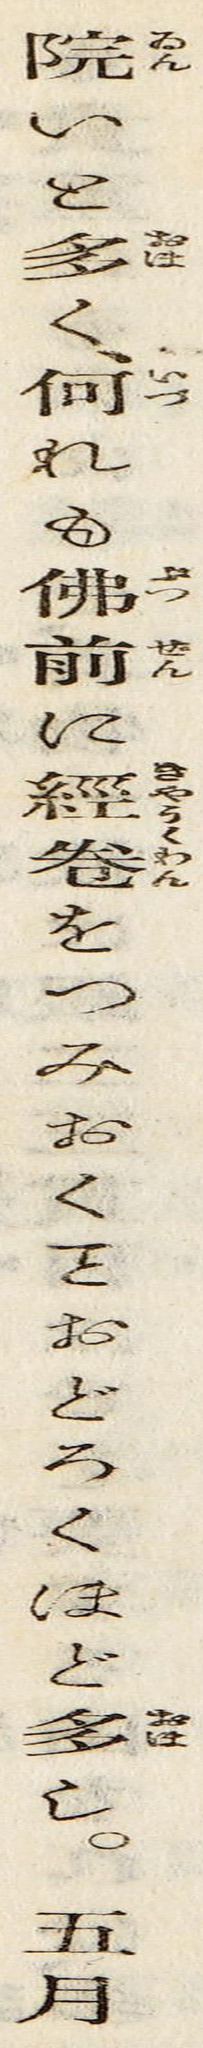院いと多く、何れも仏前に経巻をつみおくことおどろくほど多し。五月
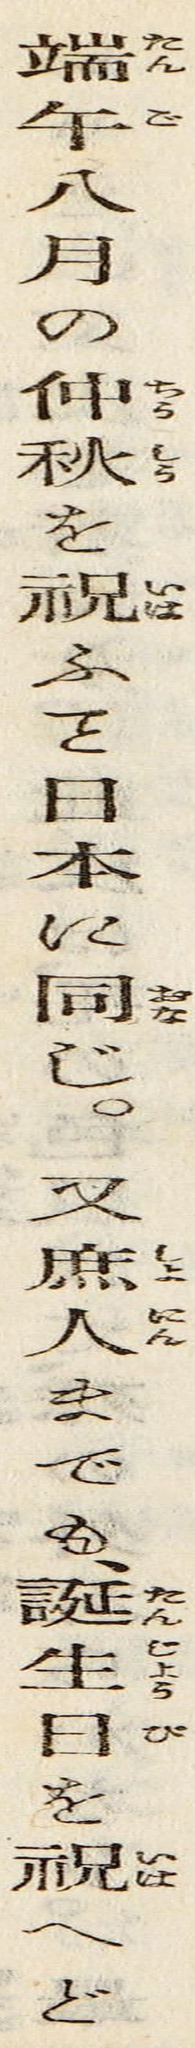端午八月の仲秋を祝ふこと日本に同じ。又庶人までも、誕生日を祝へど
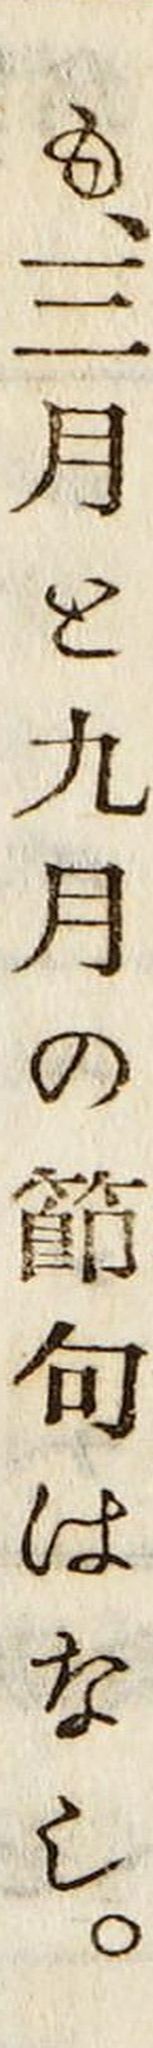も、三月と九月の節句はなし。
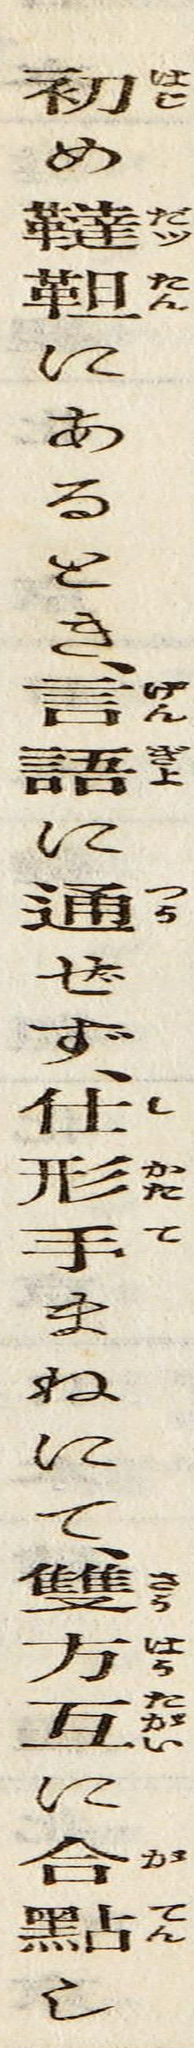初め韃靼にあるとき、言語に通ぜず、仕形手まねにて、双方互に合点し
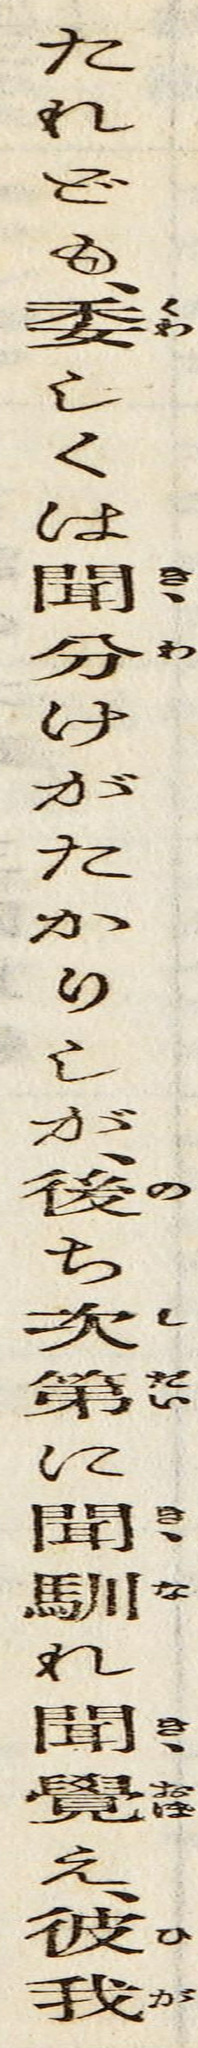たれども、委しくは聞分けがたかりしが、後ち次第に聞馴れ聞覚え、彼我
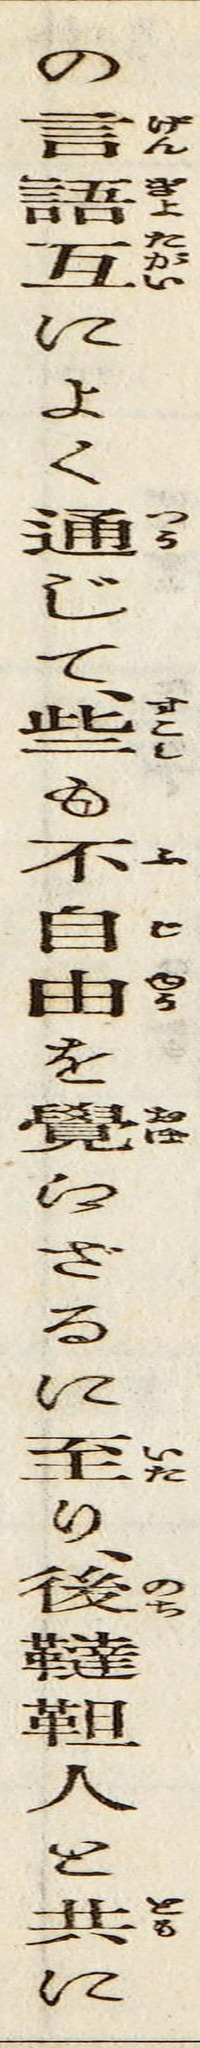の言語互によく通じて、些も不自由を覚えざるに至り、後韃靼人と共に
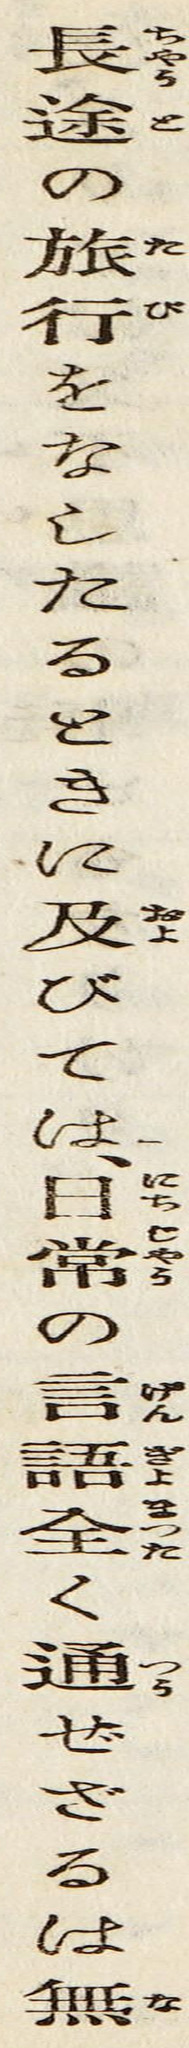長途の旅行をなしたるときに及びては、日常の言語全く通ぜざるは無
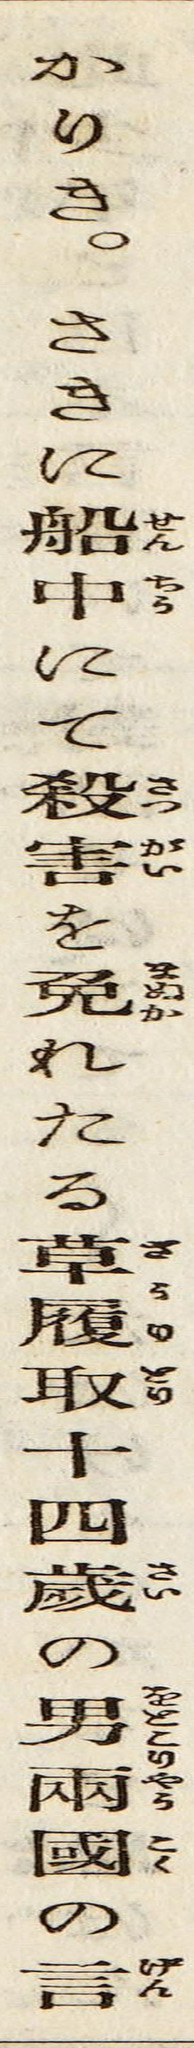かりき。さきに船中にて殺害を免れたる草履取十四歳の男両国の言
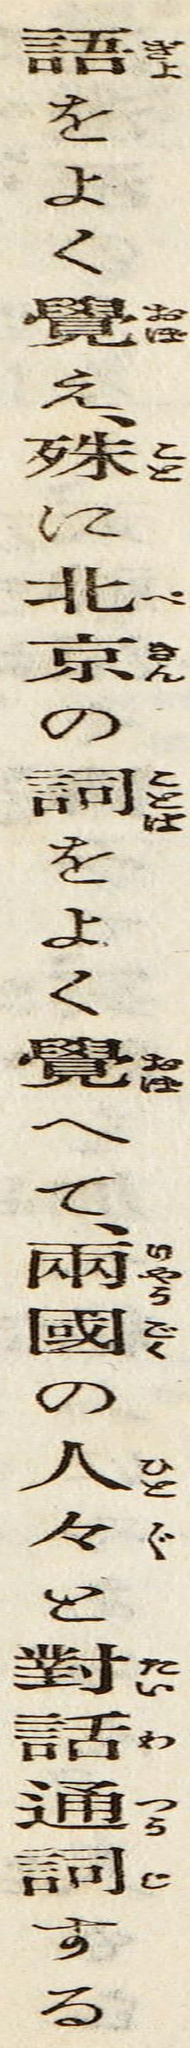語をよく覚え、殊に北京の詞をよく覚へて、両国の人々と対話通詞する
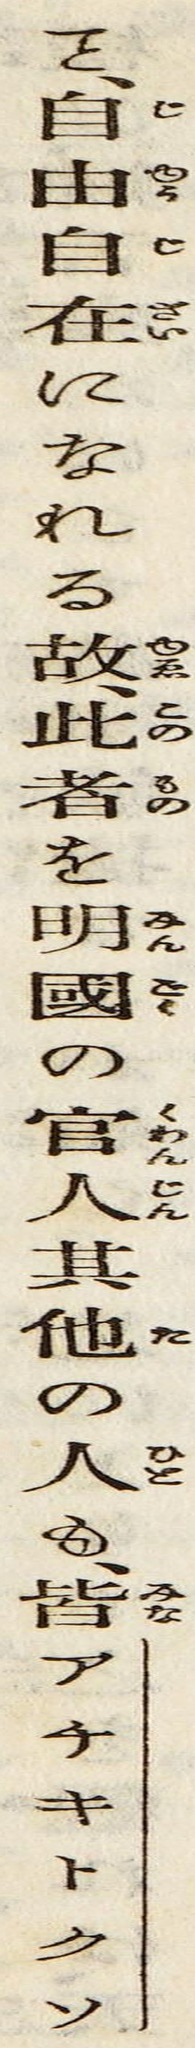こと、自由自在になれる故、此者を明国の官人其他の人も、皆アチキトクソ
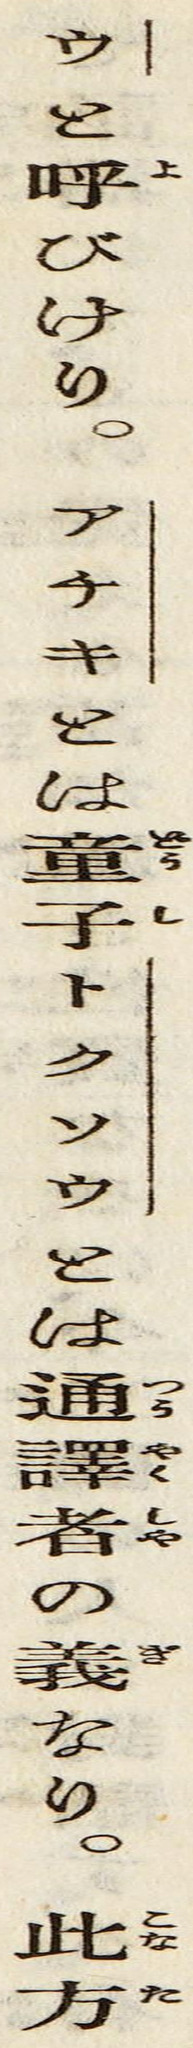ウと呼びけり。アチキとは童子トクソウとは通訳者の義なり。此方
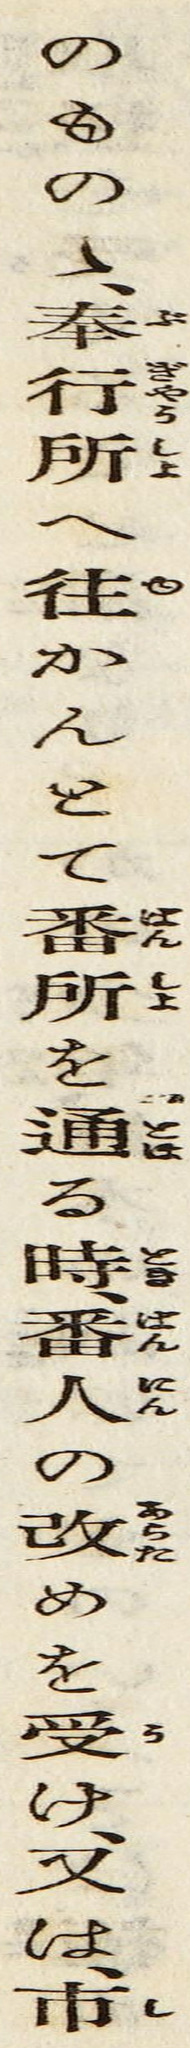のものゝ、奉行所へ往かんとて番所を通る時、番人の改めを受け、又は、市
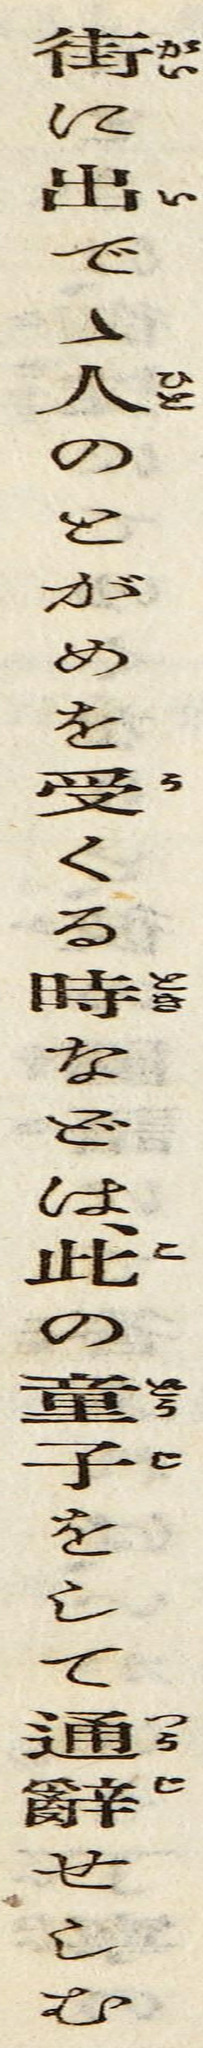街に出でゝ人のとがめを受くる時などは、此の童子をして通辞せしむ
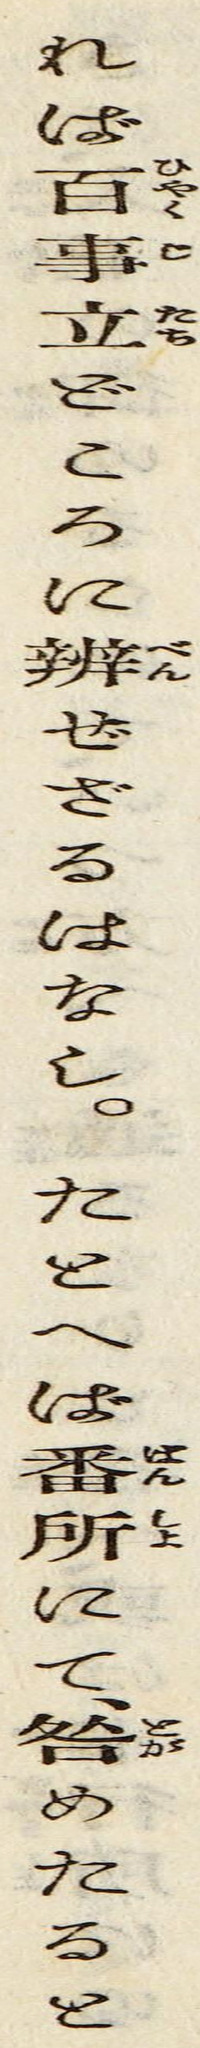れば百事立どころに弁ぜざるはなし。たとへば番所にて、咎めたると
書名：日本漂流譚
